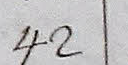42
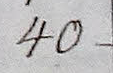40
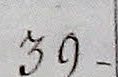39
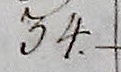34.
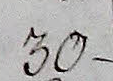30
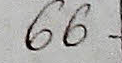66
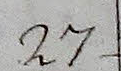27
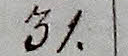31.
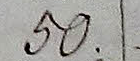50.
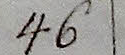46
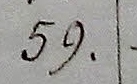59.
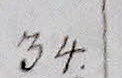34.
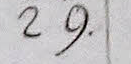29.
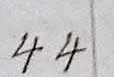44
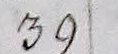39
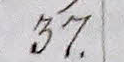37.
